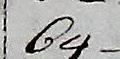64
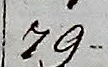79
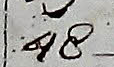48
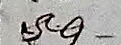59
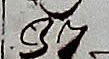37
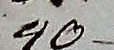40
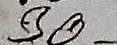30
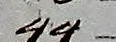44
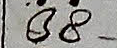38
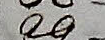29
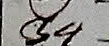34
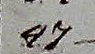47
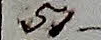57
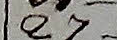27
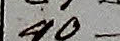40
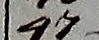47
